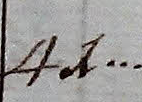41
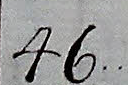46
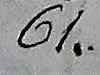61
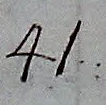41
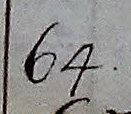64
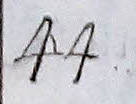44
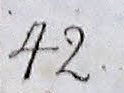42
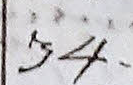34
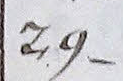29
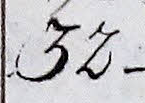32
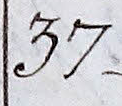37
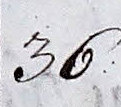36
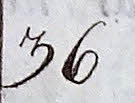36
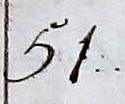51
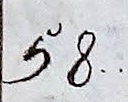58
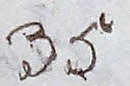35
